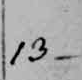13
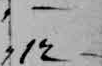12
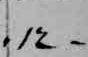12
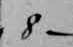8
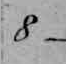8
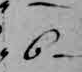6
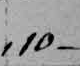10
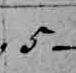5
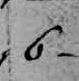6
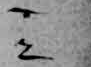2
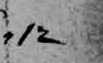12
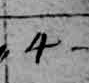4
